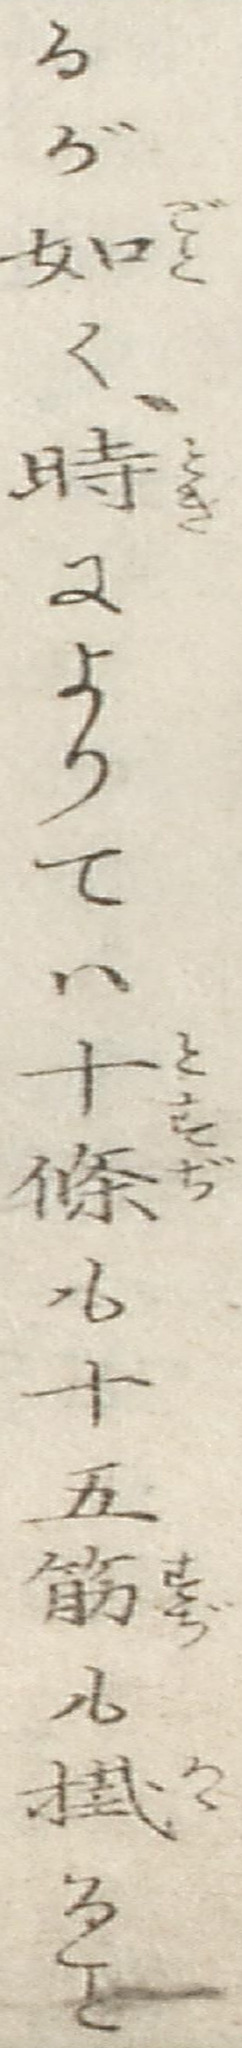るが如く、時によりては十条も十五筋も掛ること
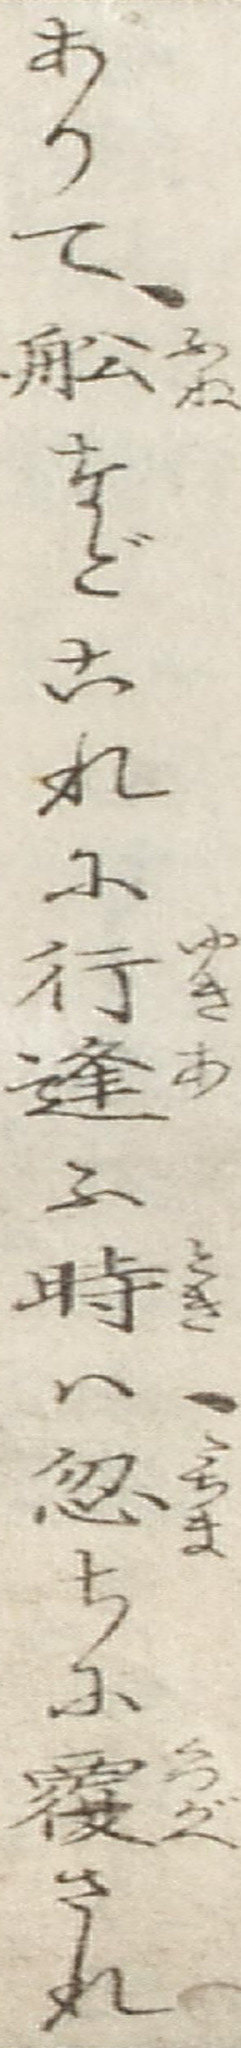ありて、船などこれに行逢ふ時は、忽ちに覆され
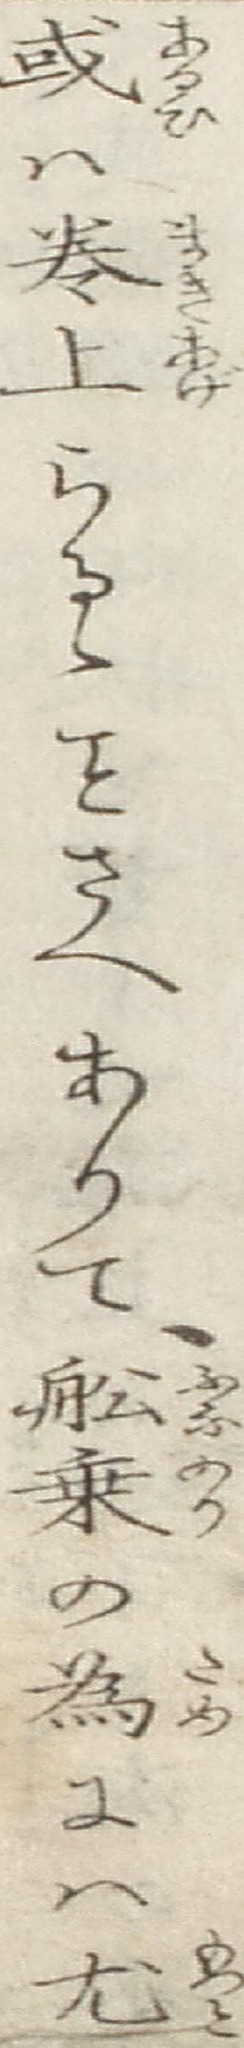或は巻上らるゝことさへありて、船乗の為には尤
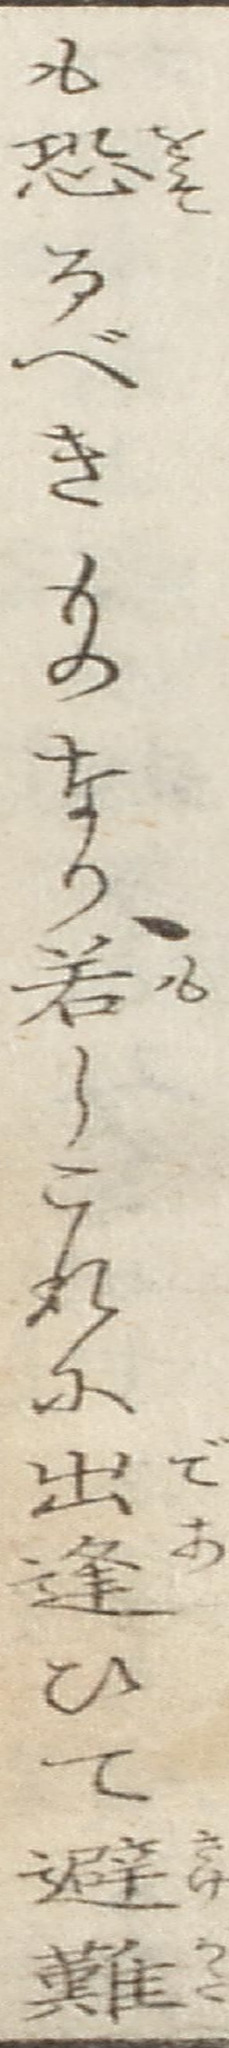も恐るべきものなり、若しこれに出逢ひて避難
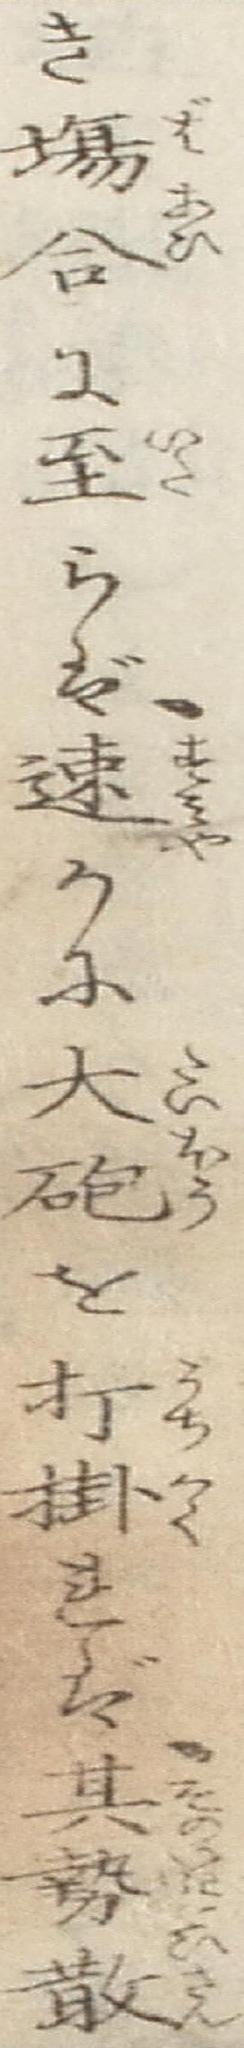き場合に至らず、速かに大砲を打掛れば、其勢散
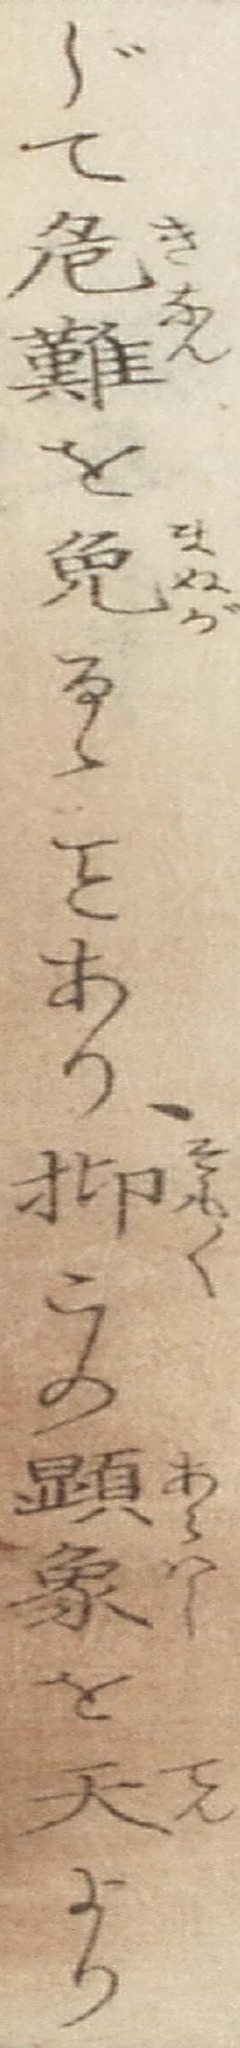じて危難を免るゝことあり、抑この顕象を天より
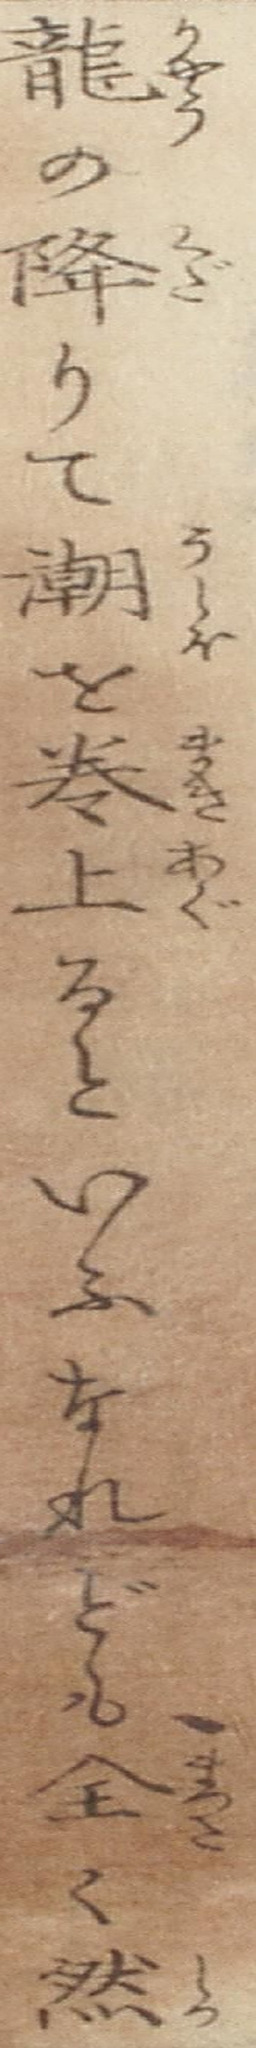龍の降りて潮を巻上るといふなれども、全く然
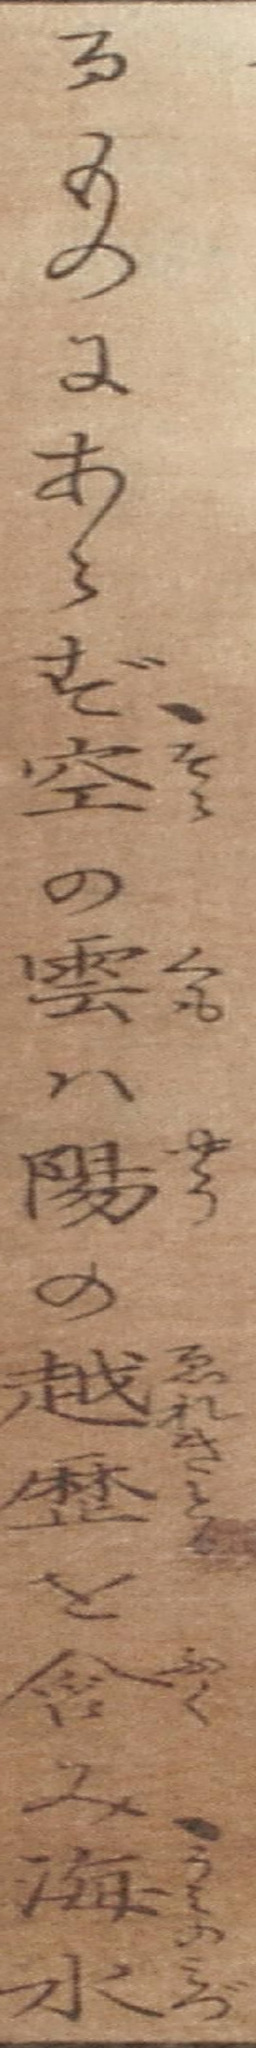るものにあらず、空の雲は陽の越歴を含み、海水
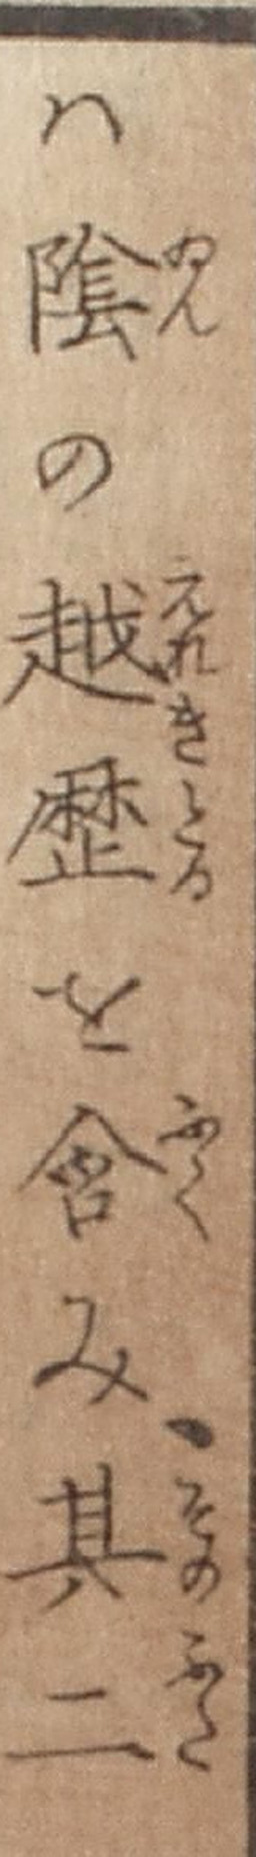は陰の越歴を含み、其二
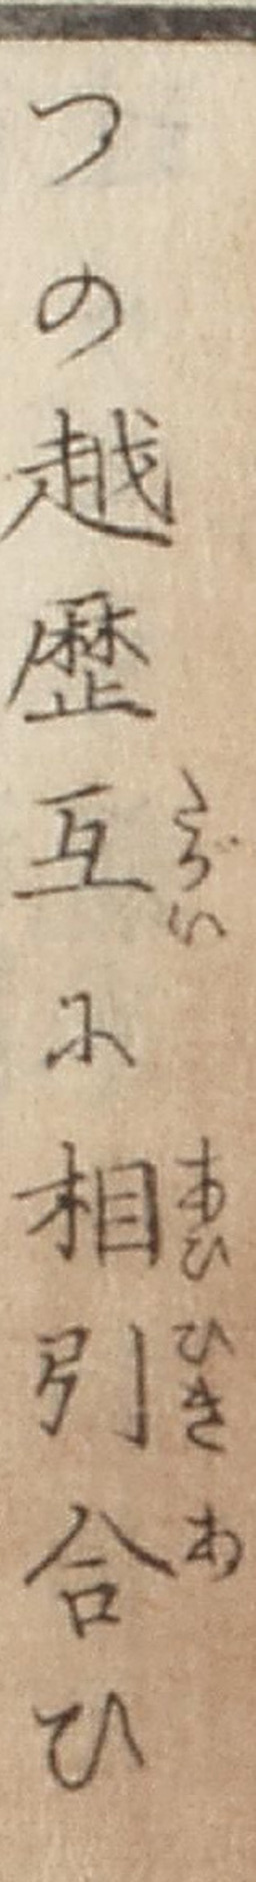つの越歴互に相引合ひ
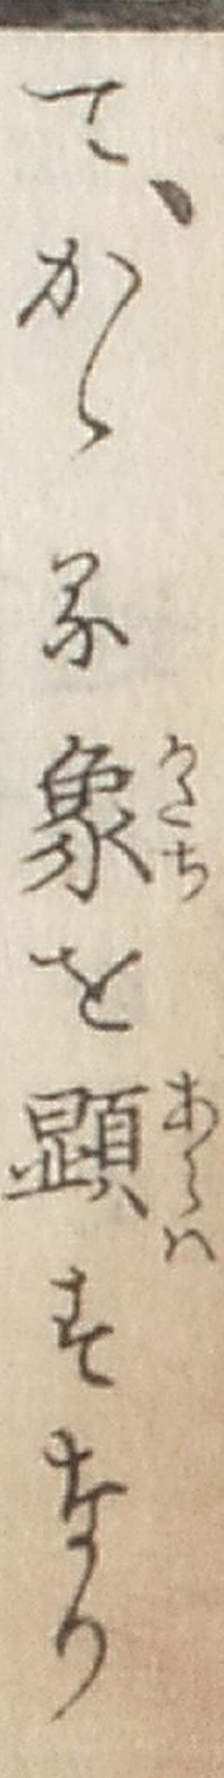て、かゝる象を顕すなり
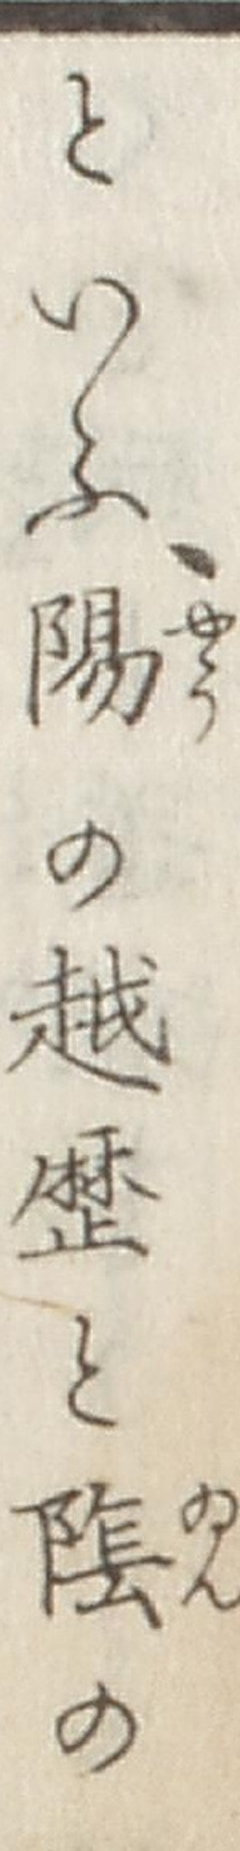といふ、陽の越歴と陰の
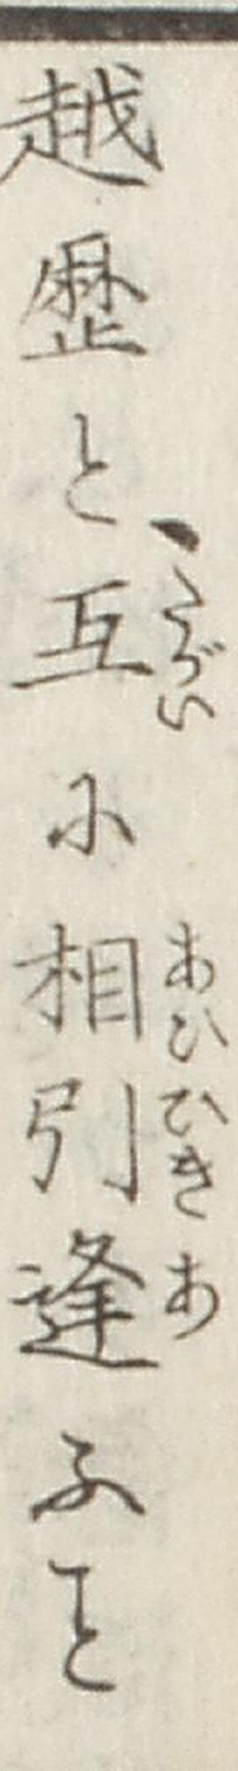越歴と、互に相引逢ふこと
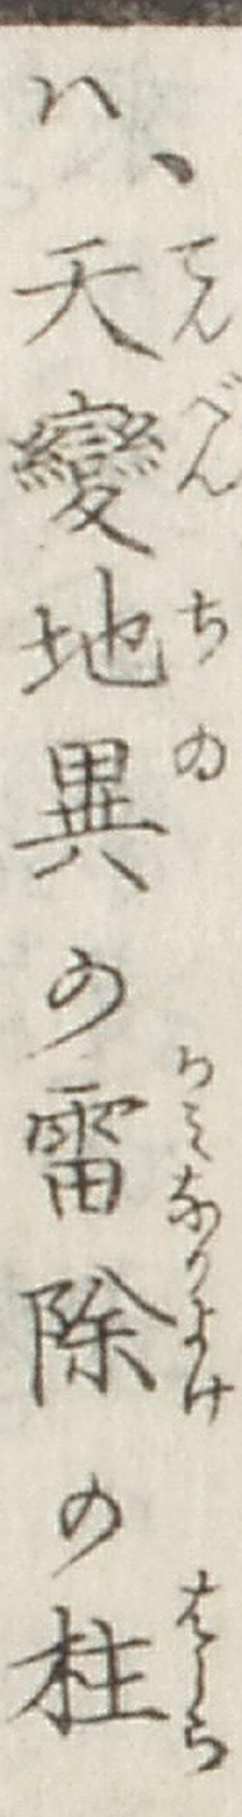は、天変地異の雷除の柱
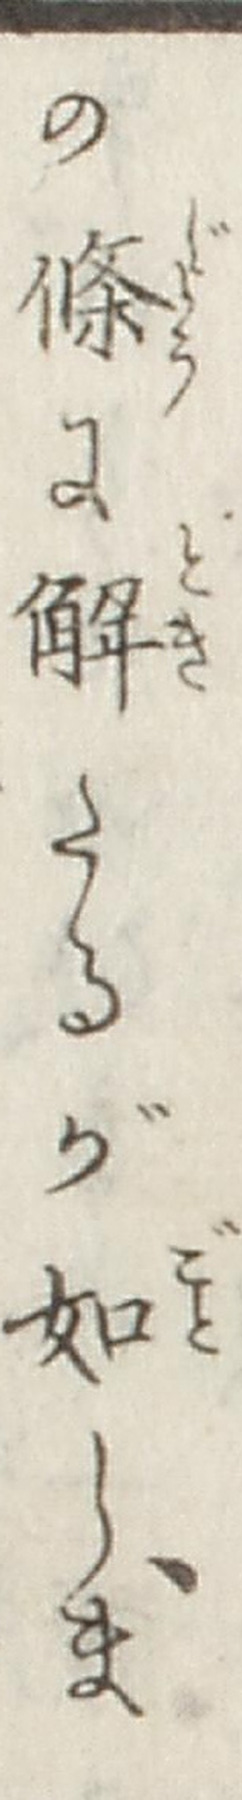の条に解たるが如し、ま
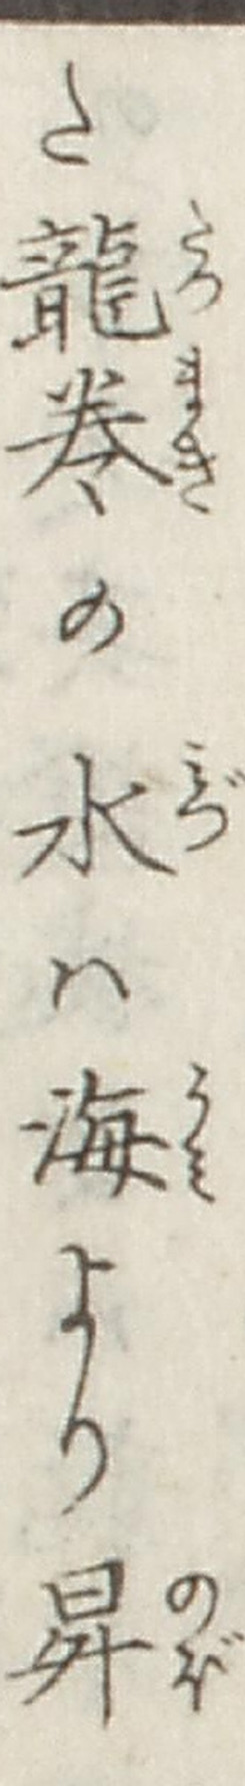た龍巻の水は海より昇
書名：変異辯　一名、天變地異拾遺　全
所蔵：東京大学地震研究所図書室 Earthquake Research Institute Library, The University of Tokyo, JAPAN
